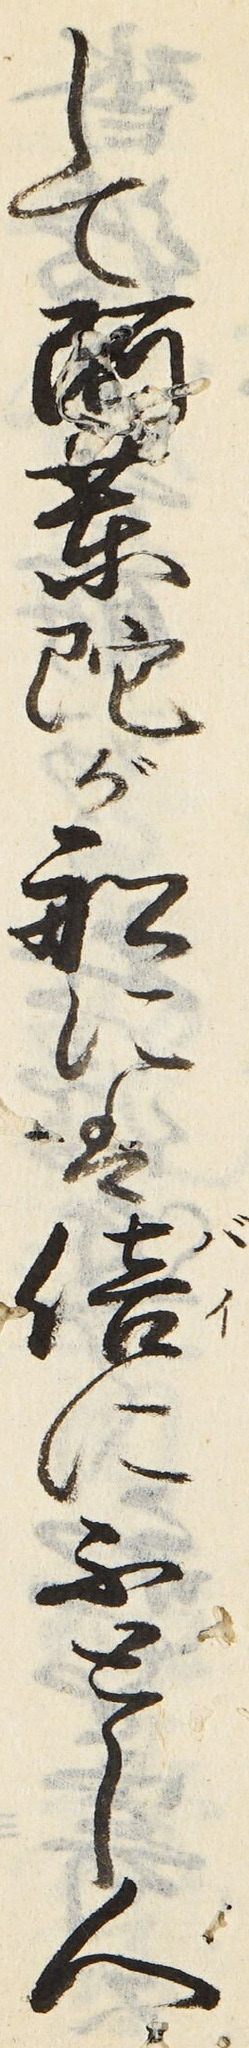して阿蘭陀が船には倍にふとし人
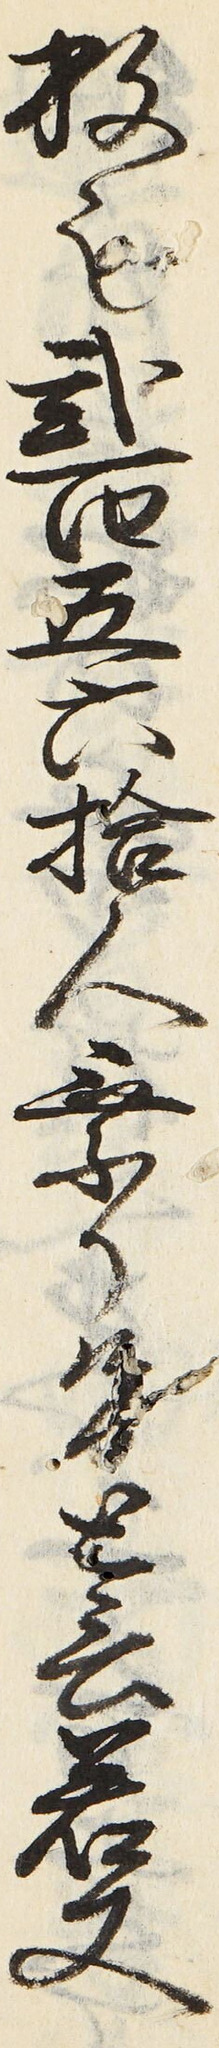数も弐百五六拾人乗りけると云若又
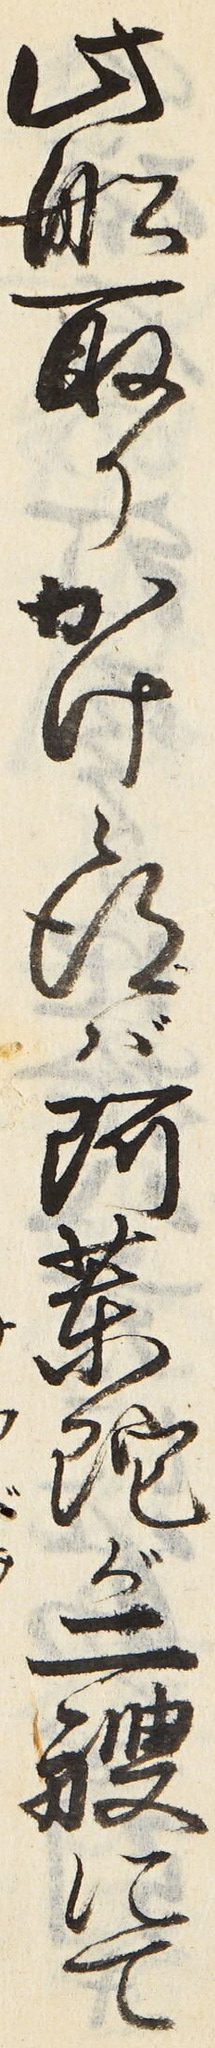此船取りかけ候得ば阿蘭陀が二艘にて
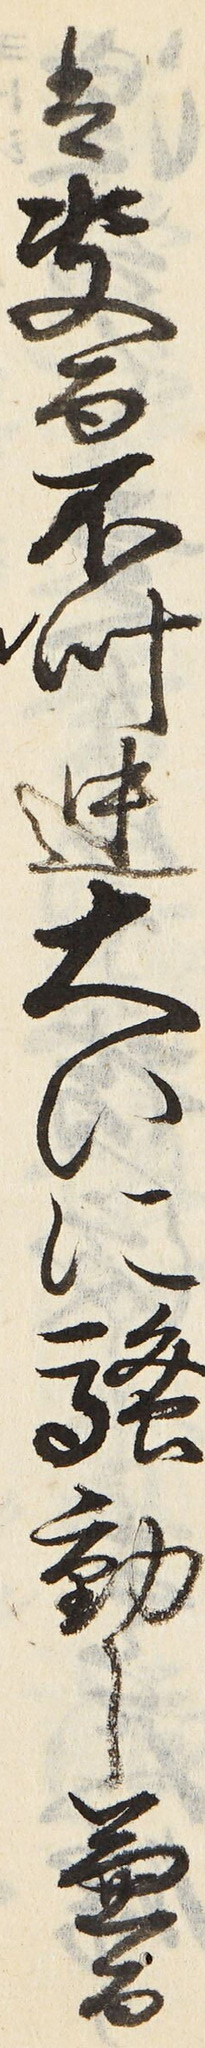は決而不叶迚大ひに騒動し兼而
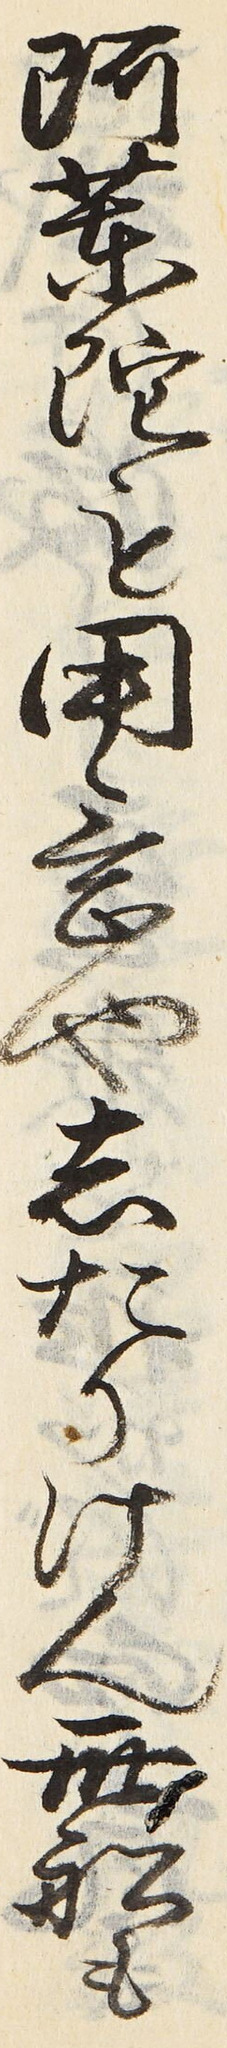阿蘭陀も用意やしたりけん此船も
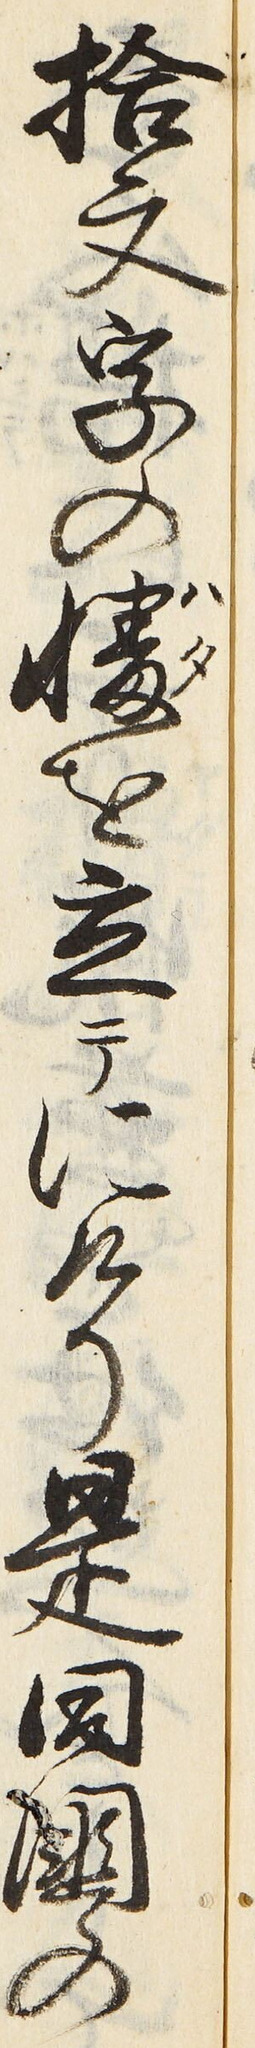拾文字の幡を立てにけり是同国の
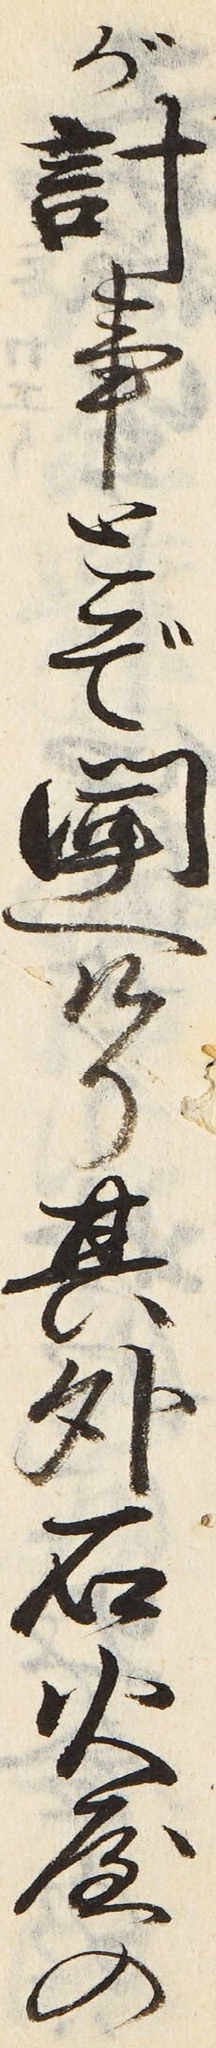が計事とぞ聞へけり其外石火屋の
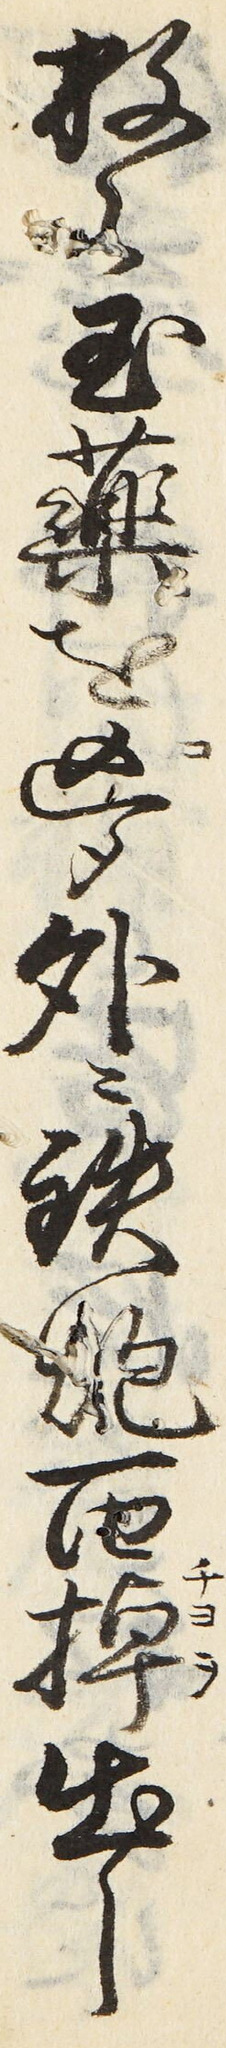数々玉薬を込め外に鉄砲百棹出し
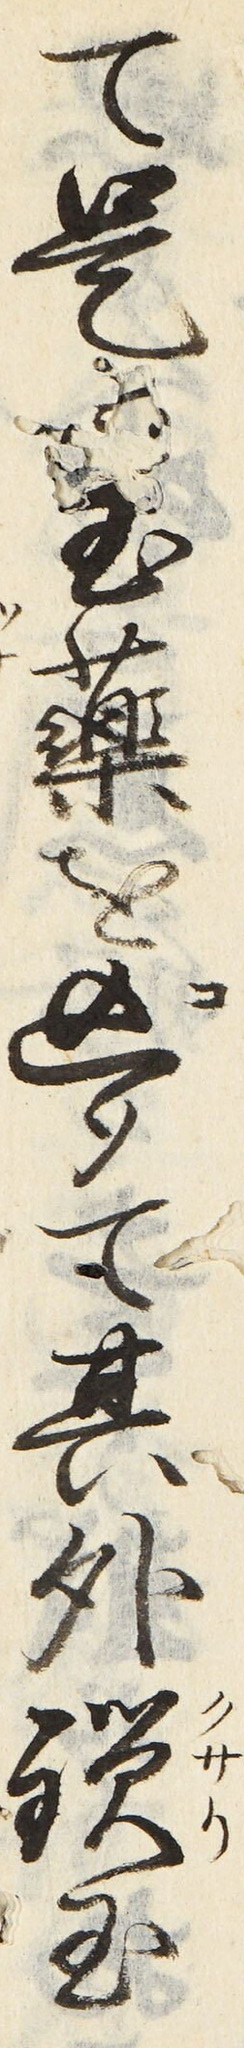て是玉薬を込めて其外鎖玉
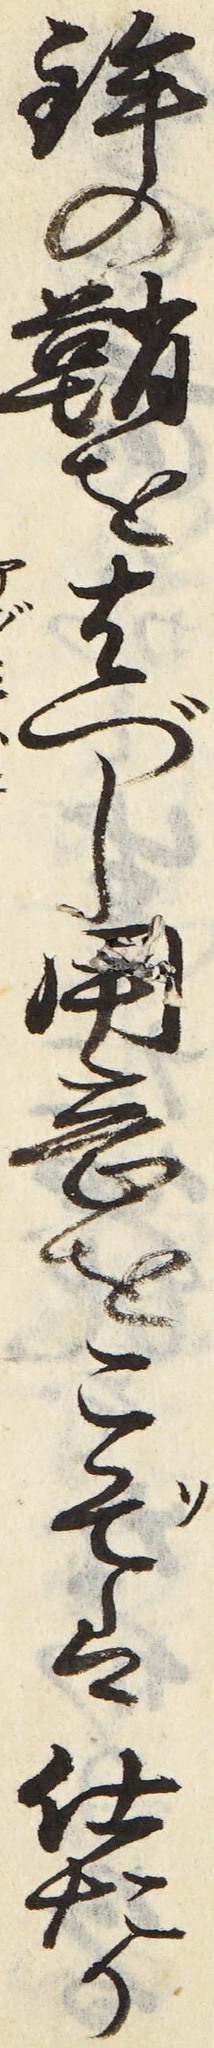鉾の鞘をはづし用意をこそは仕たり
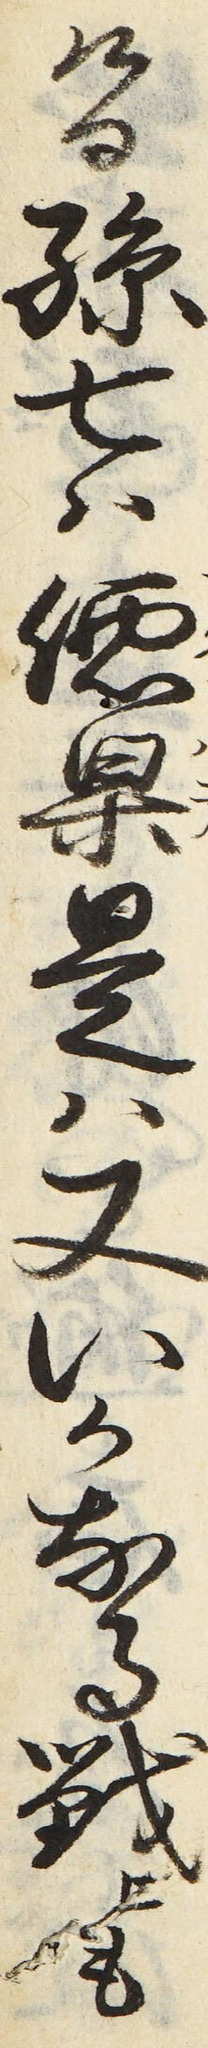ける孫七は果是は又いかなる戦にも

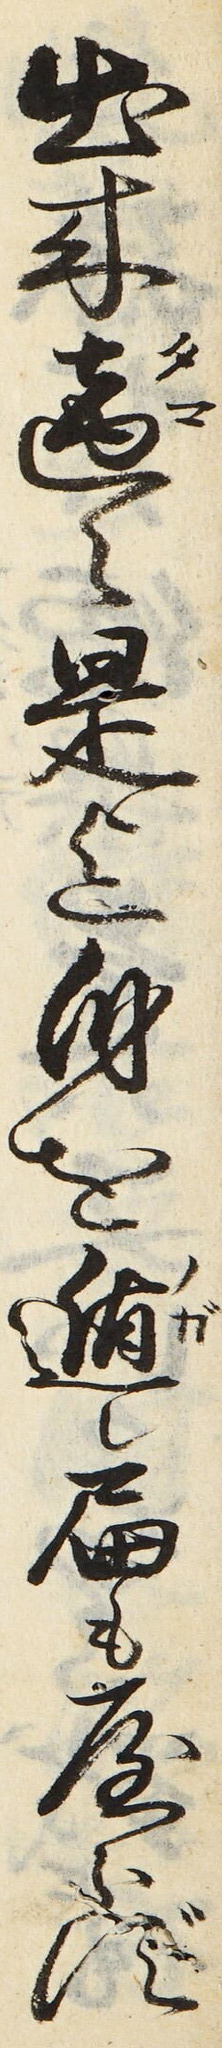出来適々是迄身を遁れ届もやらず
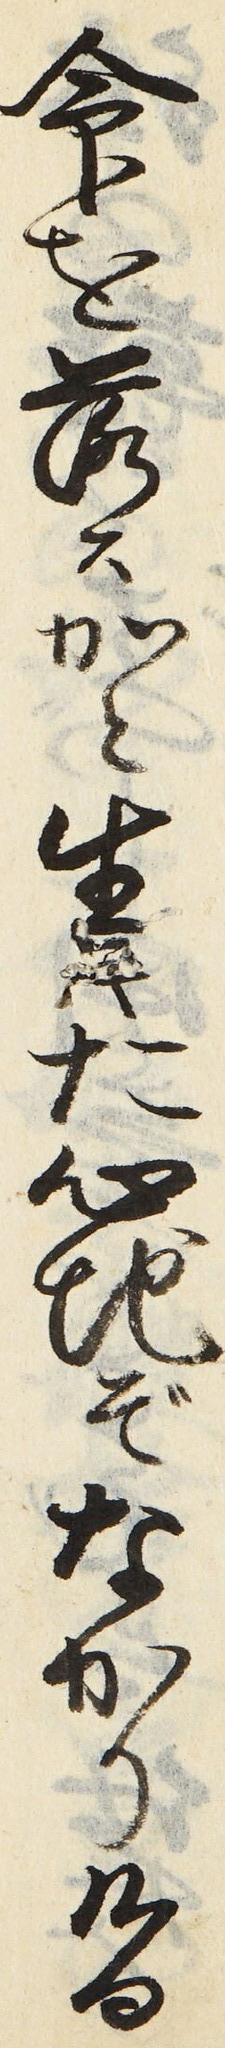命を落すかと生きた心地ぞなかりける
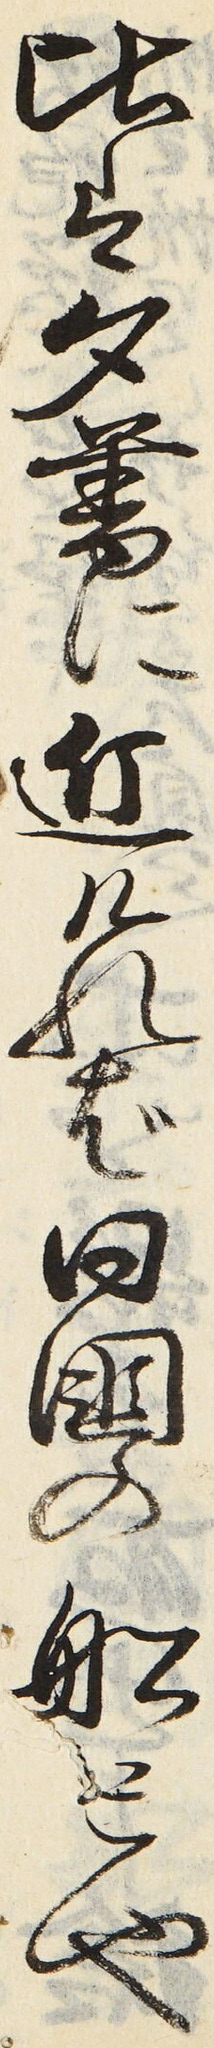此は夕暮に近ければ同国の船とや
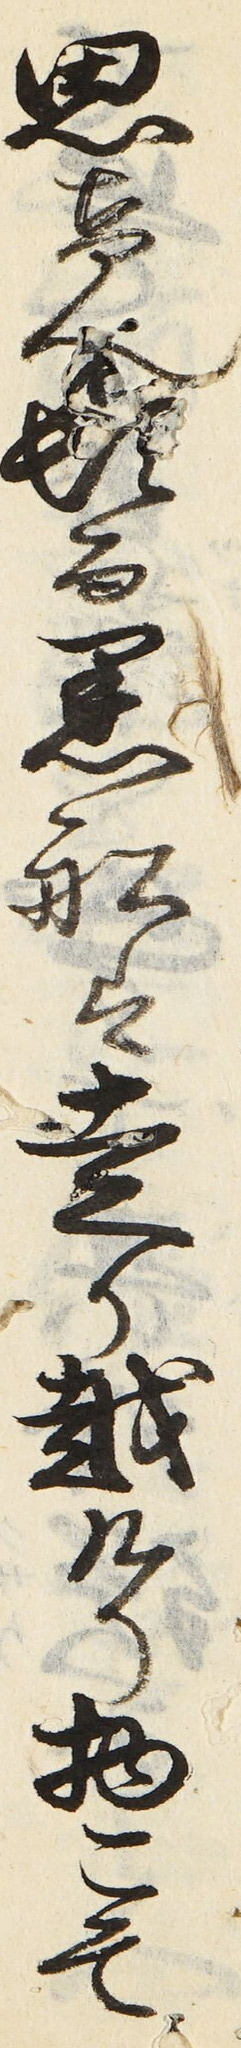思けん頓而黒船は走り越けり物こそ
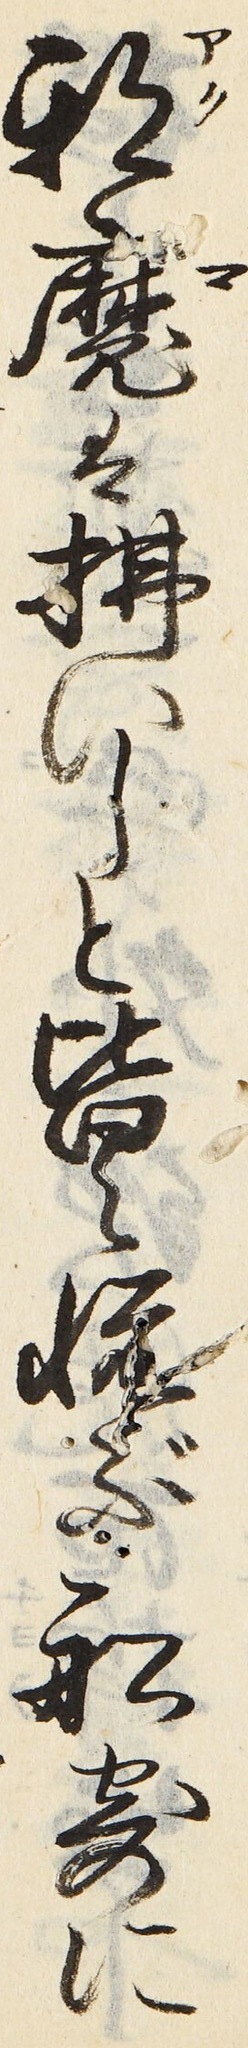邪魔は払いしと皆々悦ぶ船寄に
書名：華夷九年録
